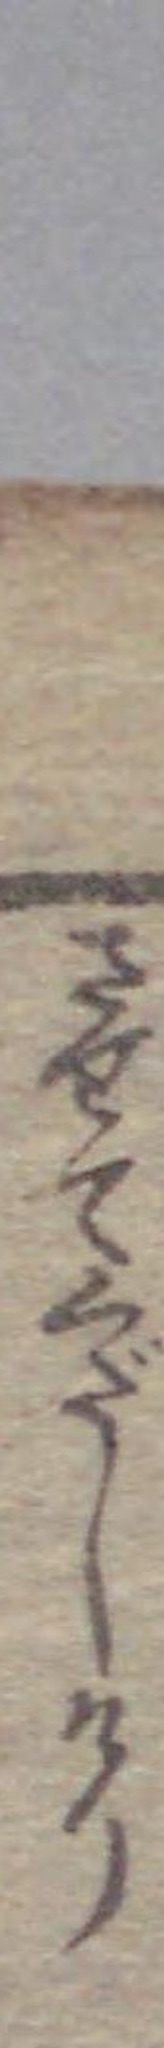させてくだしけり

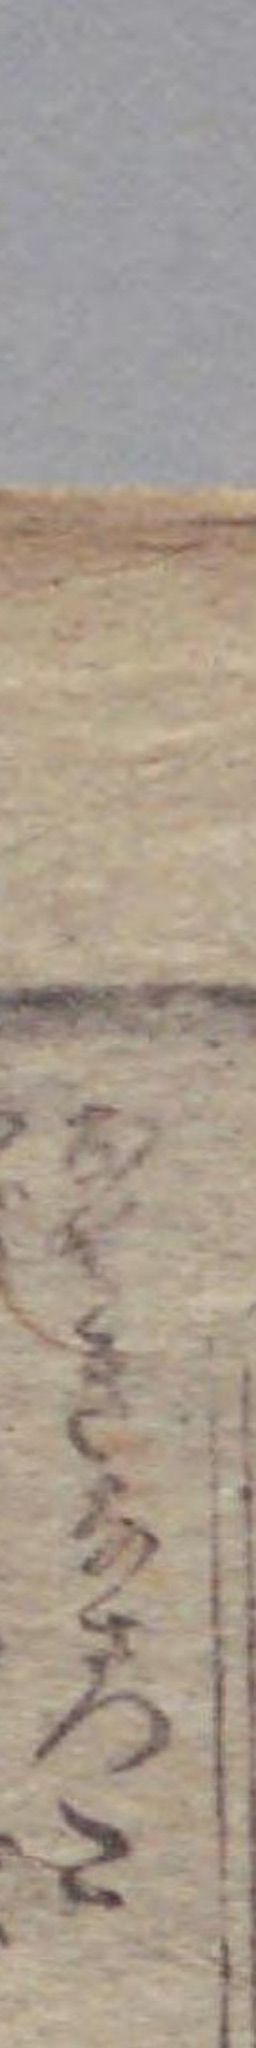おきなさつた
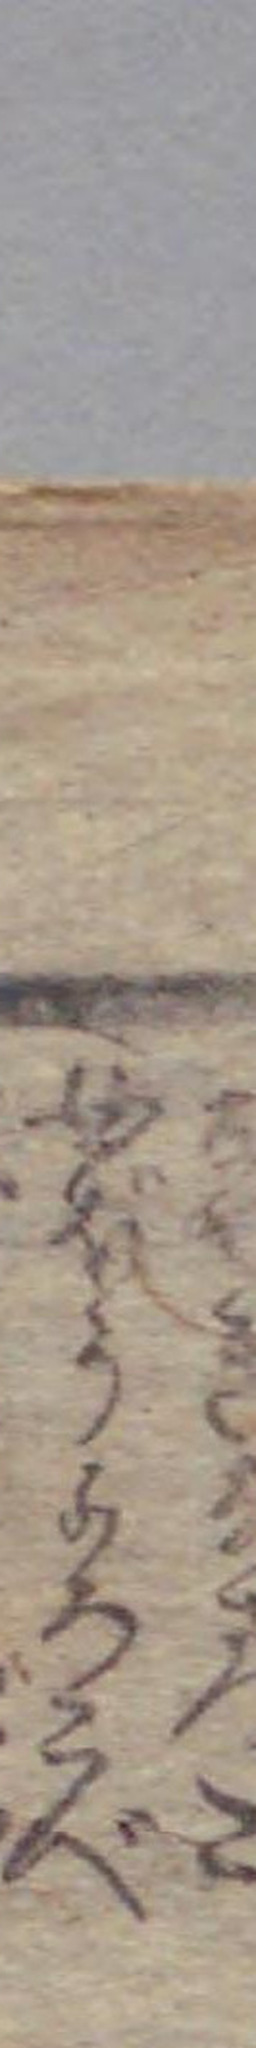女ぼうよろこべ
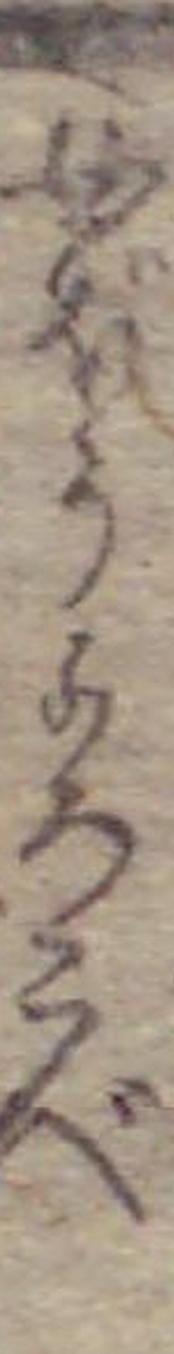女ぼうよろこべ
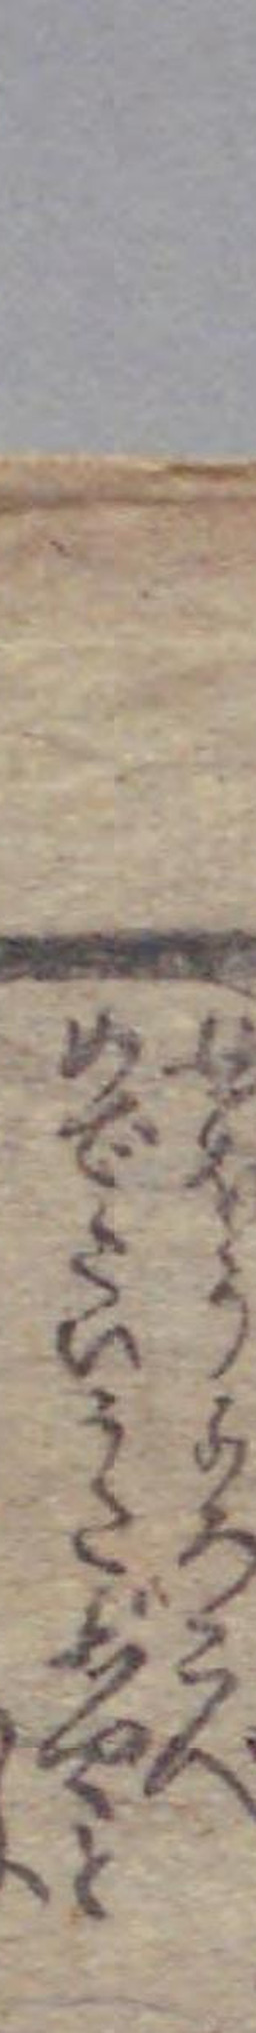めでたいうたじやと
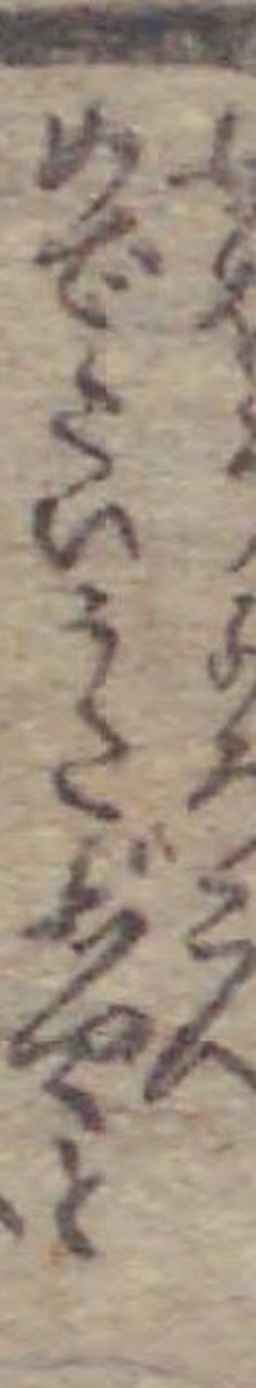めでたいうたじやと

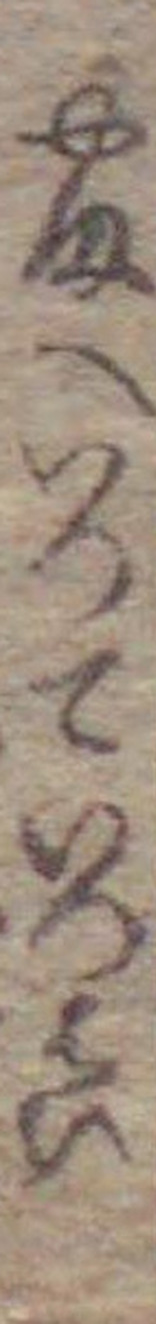やまへいつていつはい
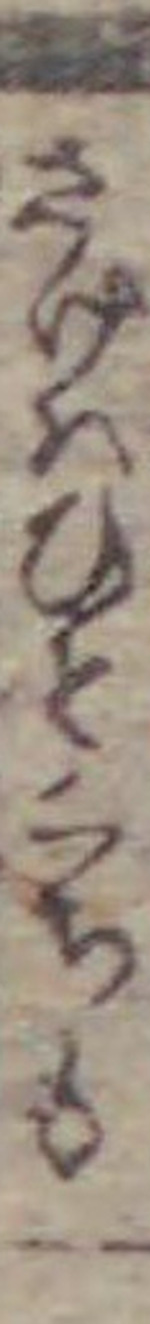さけはひとくちも
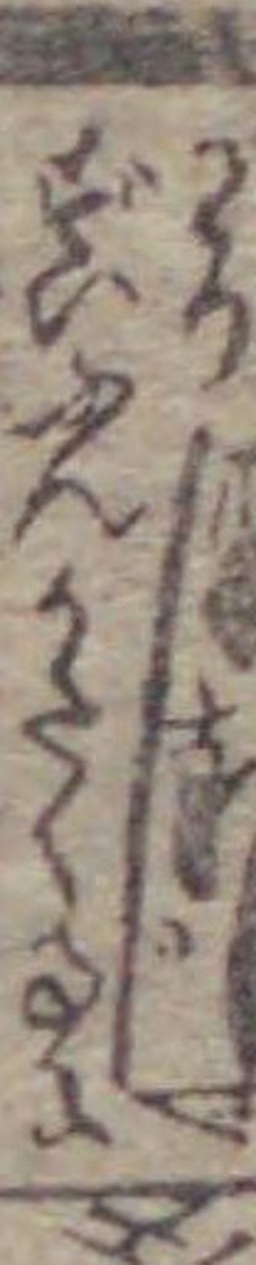ずいふんかたく事
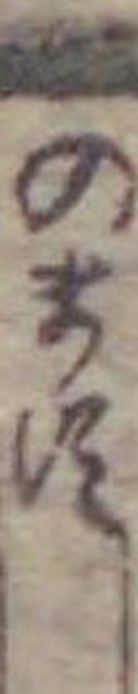のます
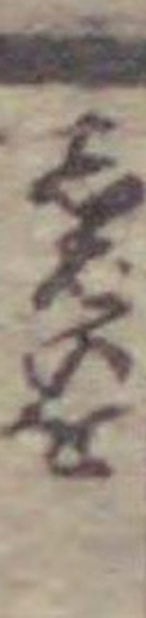しはいを
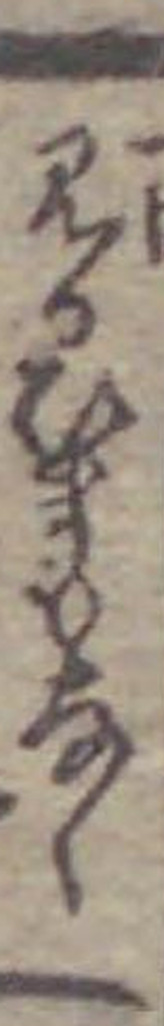見るひまもなく
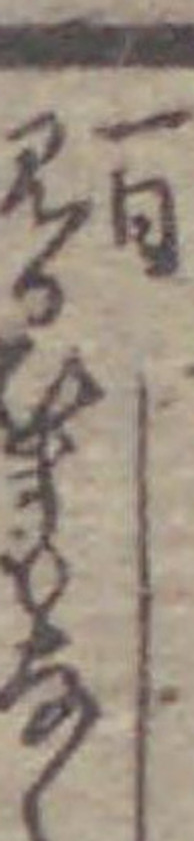見るひまもなく
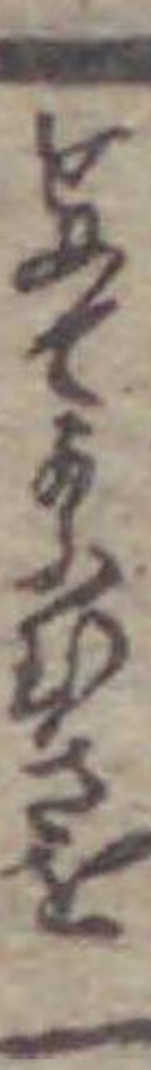せめてよふむきを
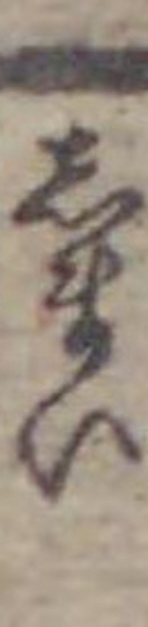しまい
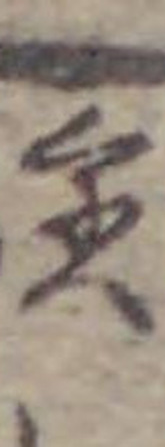くにへ
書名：見通占 : 3巻
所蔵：国立国会図書館 National Diet Library, JAPAN
